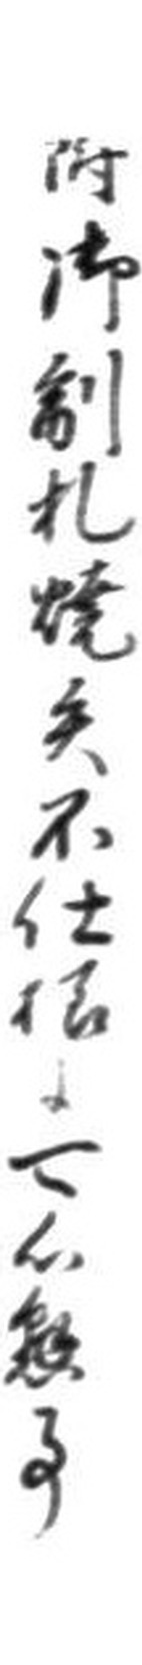附御制札焼失不仕様に可心懸事
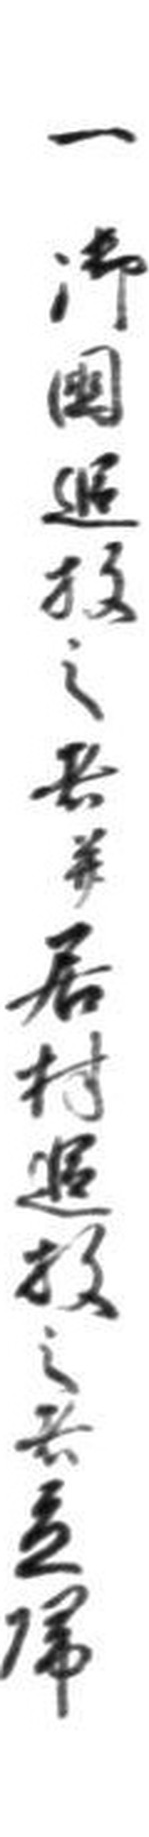一御国追放之者并居村追放之者立帰
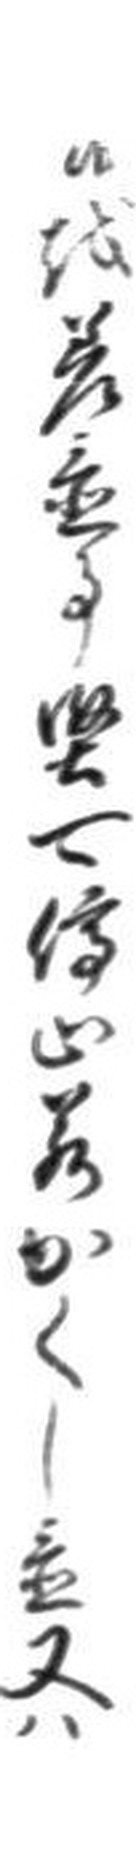候を差置事堅可停止若かくし置又は
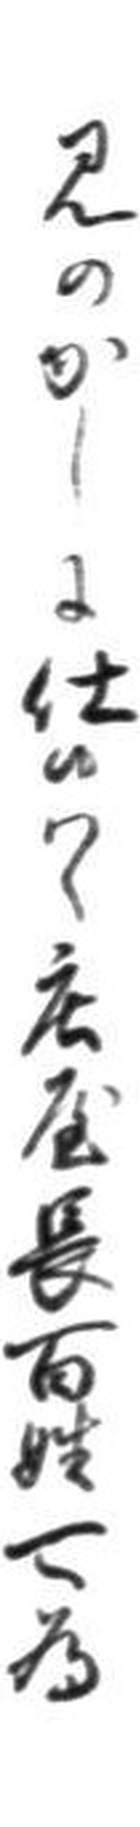見のかし仕候はゝ庄屋長百姓可為

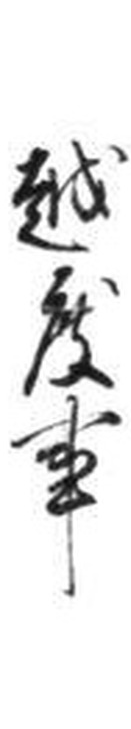越度事
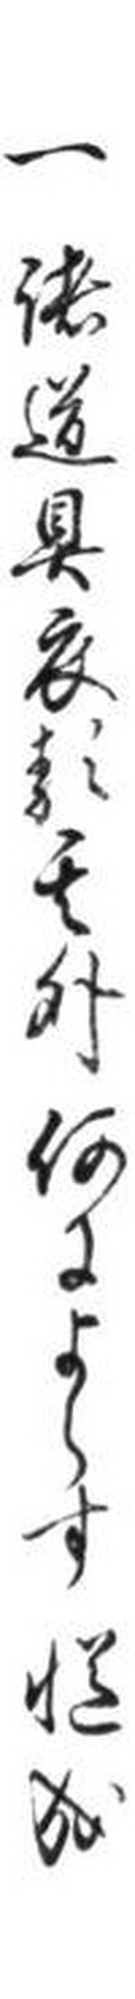一諸道具衣類其外何によらす慥成
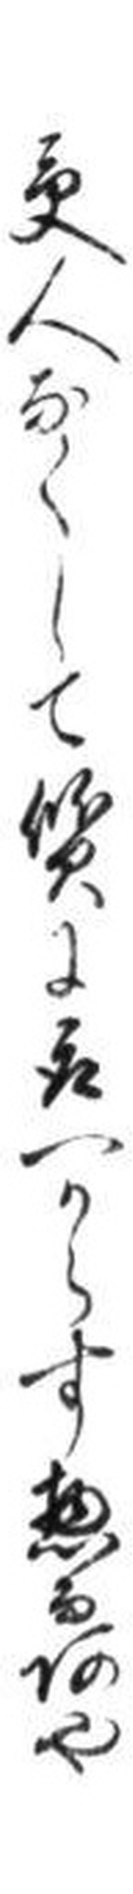受人なくして質に取へからす惣而あや
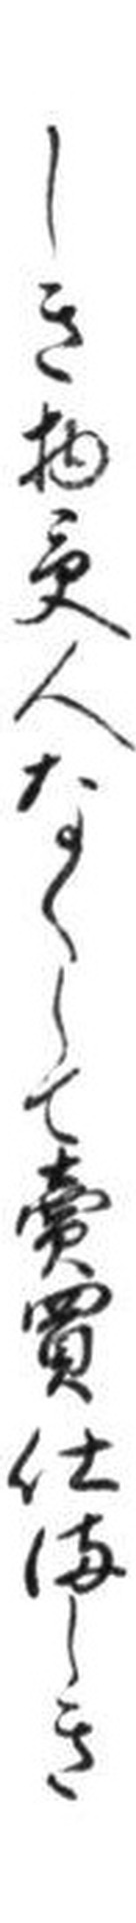しき物受人なくして売買仕満しき
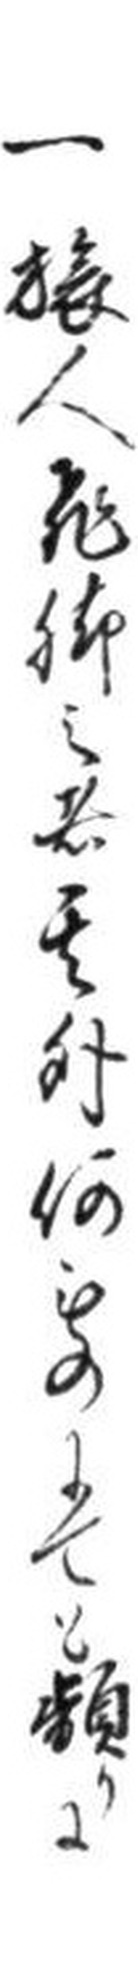一旅人飛脚之者其外何ものにても頻りに
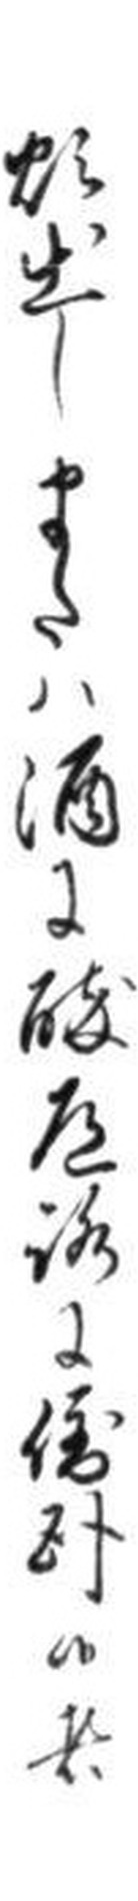煩出しまたハ酒に酔道路に倒臥候者
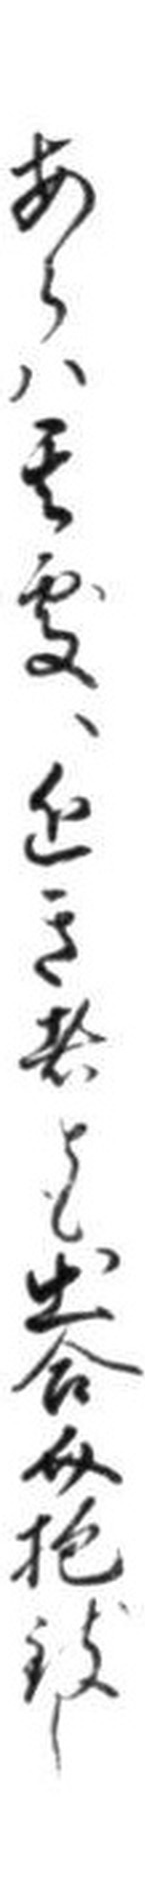あらハ其処へ近き者とも出合介抱致し
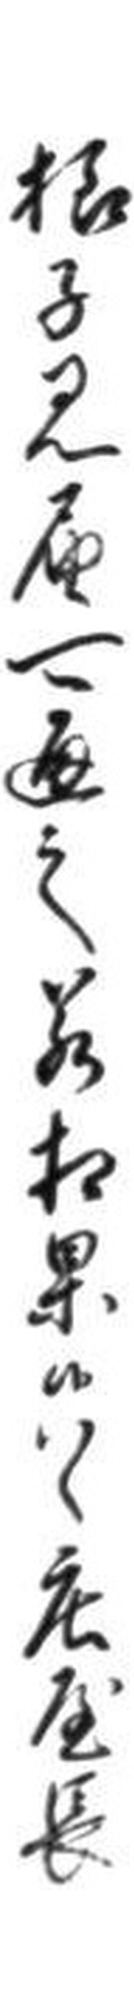様子見届可通之若相果候ハヽ庄屋長
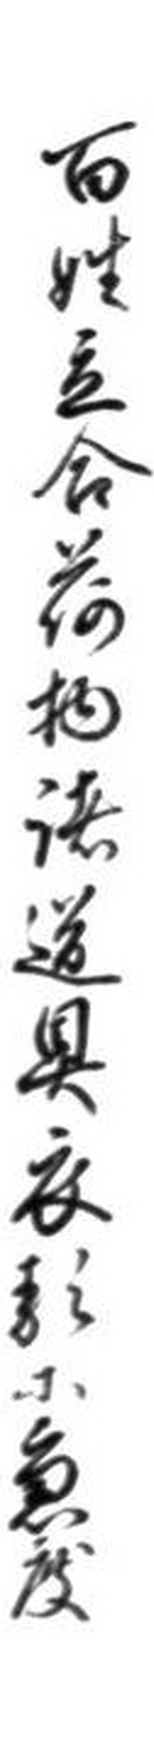百姓立合荷物諸道具衣類等屹度急度
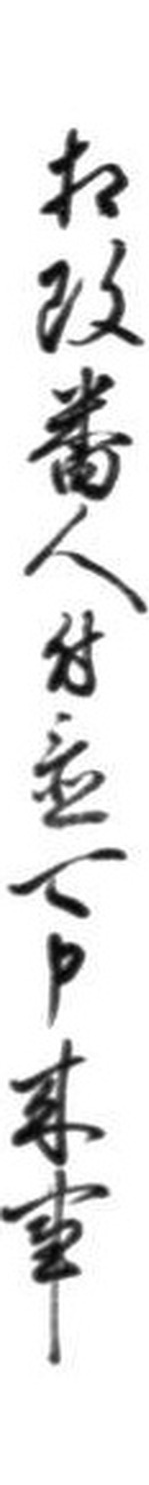相改番人付置可申来事
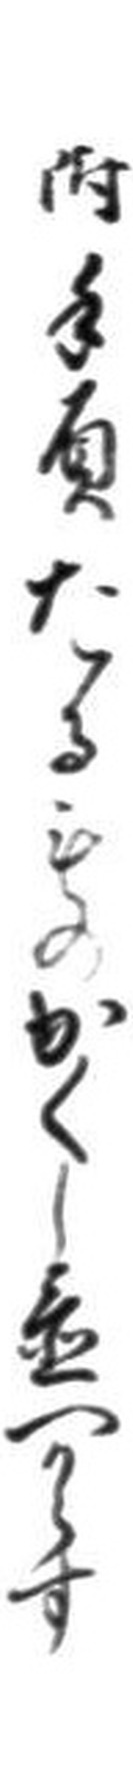附手負たるものかくし置へからす
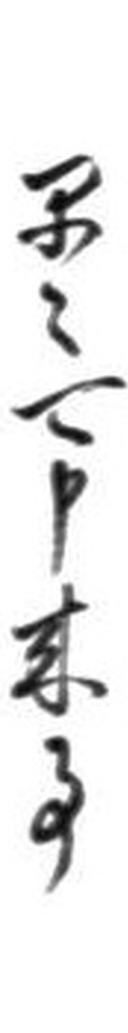早々可申来事
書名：家譜 十六 吉品公 従貞享三年閏三月到同四年
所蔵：福井県文書館 Fukui Prefectural Archives
